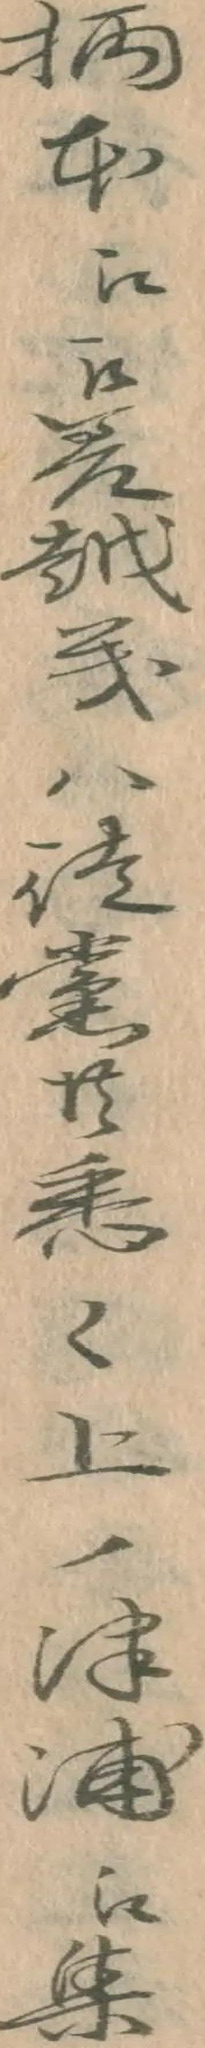栖本江被差越義は徒党共悉く上之津浦江集
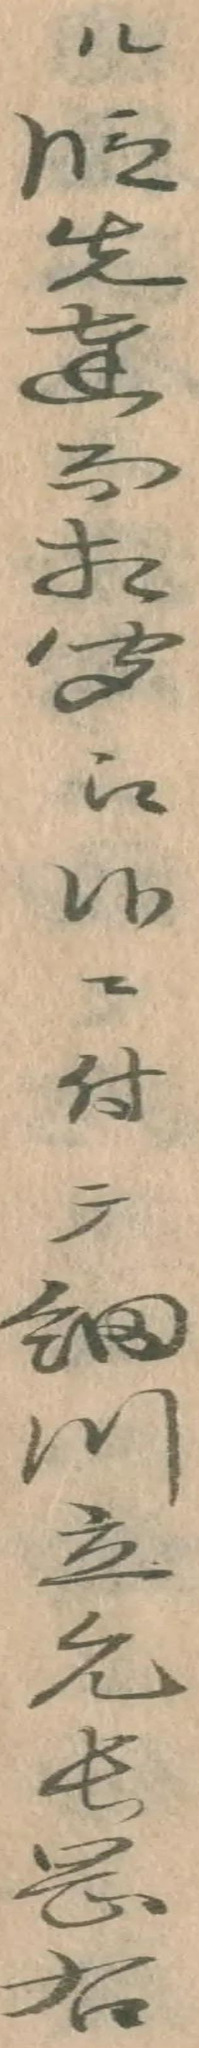候段先達而相聞江候に付て細川立允長岡右
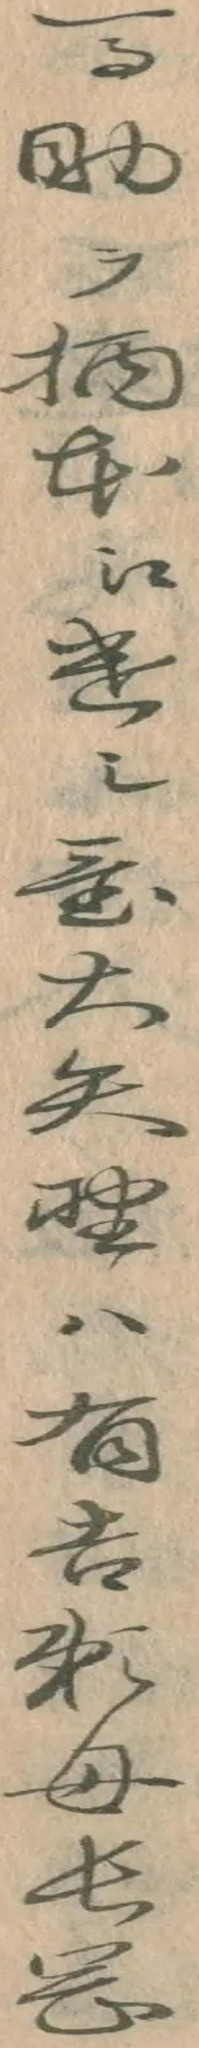馬助を栖本江遣し置大矢野は有吉頼母長岡
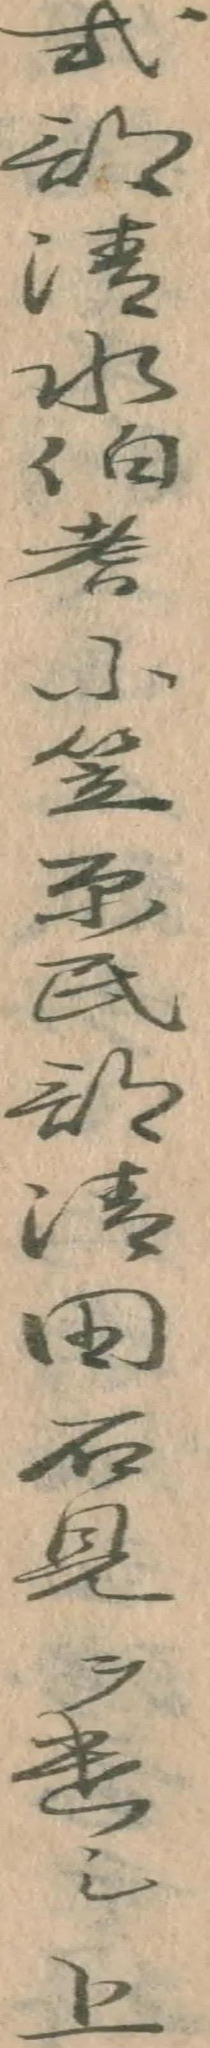式部清水伯耆小笠原民部清田石見を遣し上
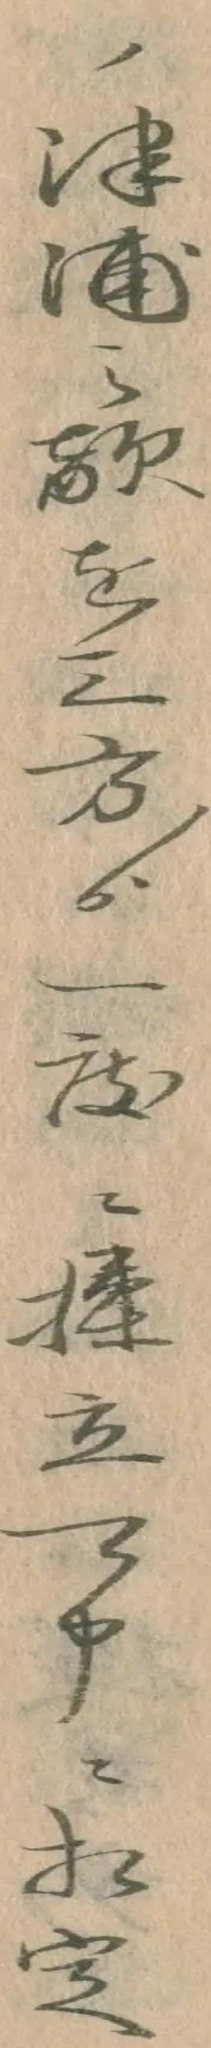之津浦之敵を三方ゟ一度に揉立可申に相定
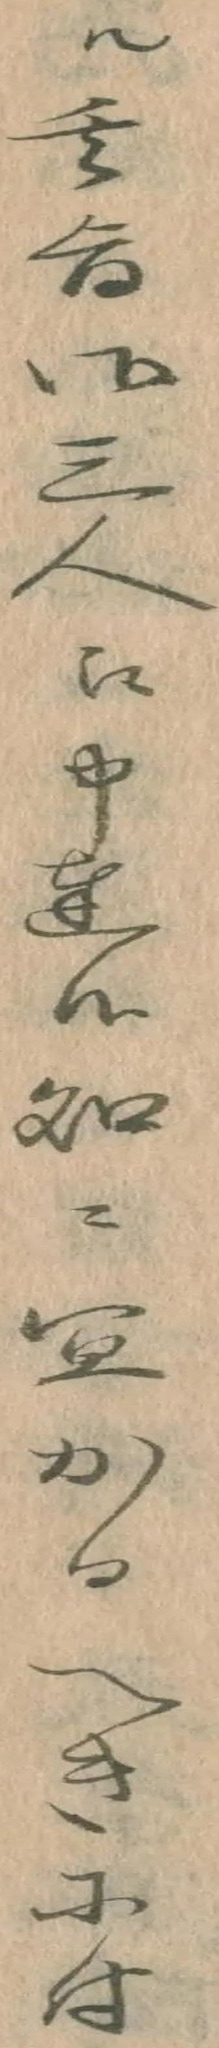候其旨御三人江申達候処に冝かるへき尓付
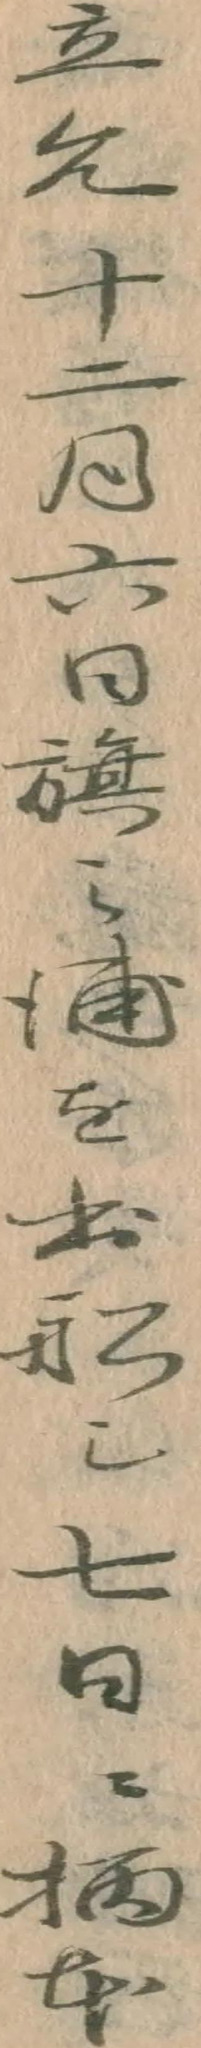立允十二月六日旗之浦を出舩し七日に栖本
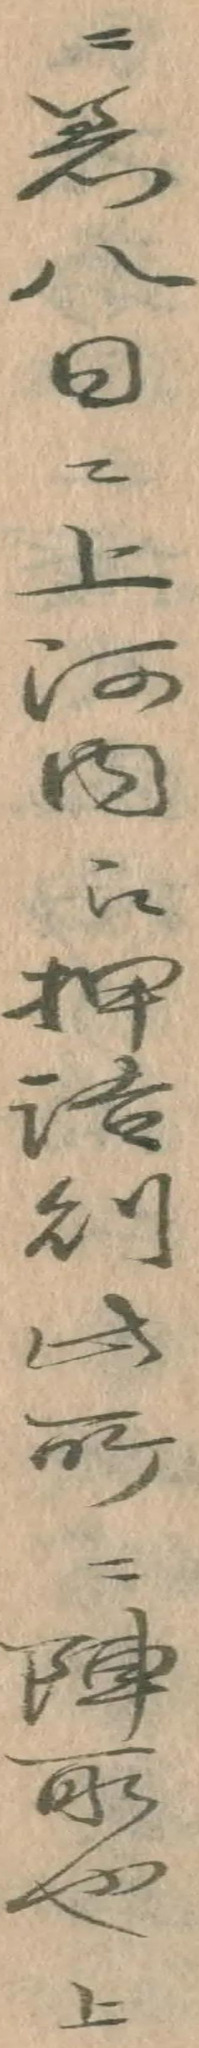に着八日に上河内江押詰則此所に陣取也上
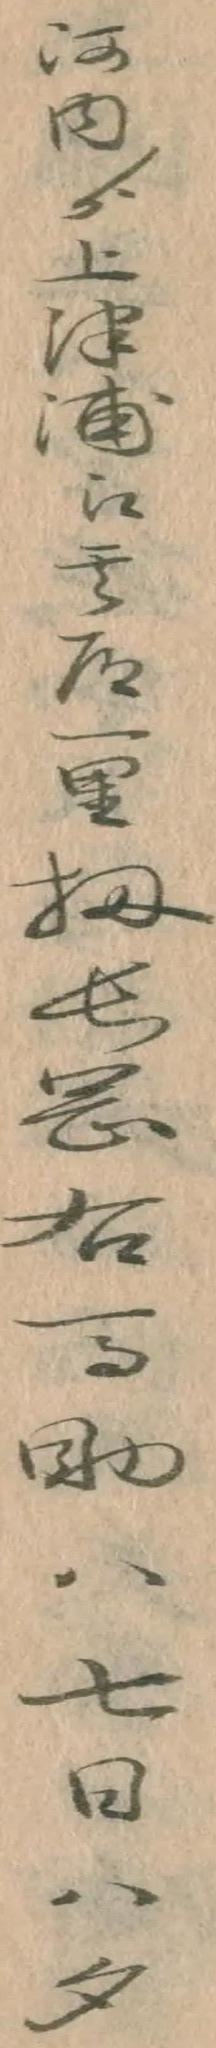河内ゟ上津浦江其道一里扨長岡右馬助は七日は夕
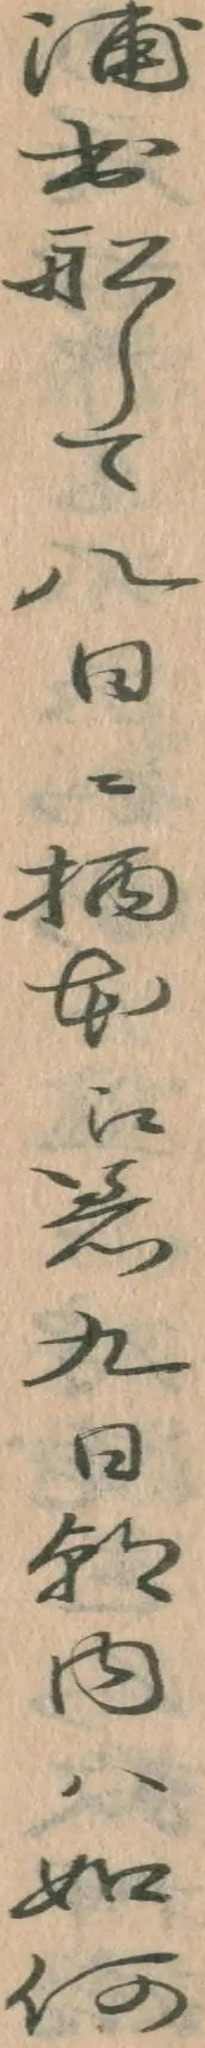浦出船して八日に栖本江着九日朝内は如何
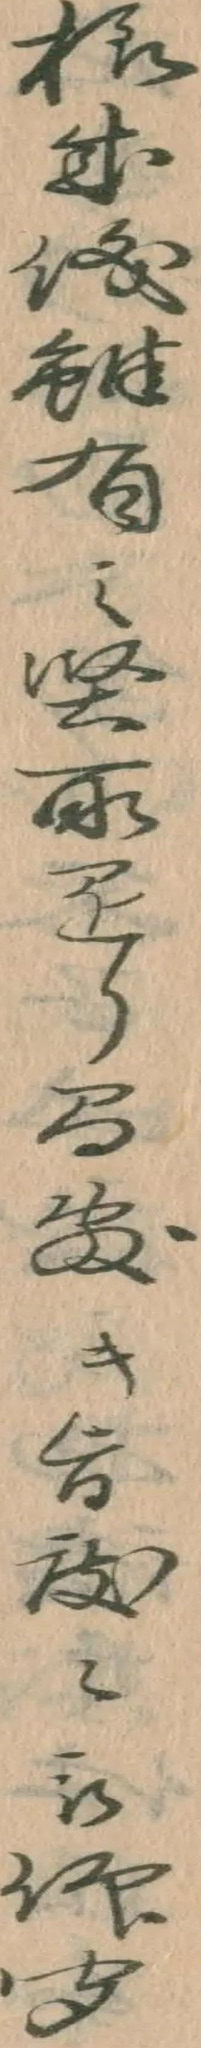様成儀雖有之堅取懸り間敷き旨度々被仰聞
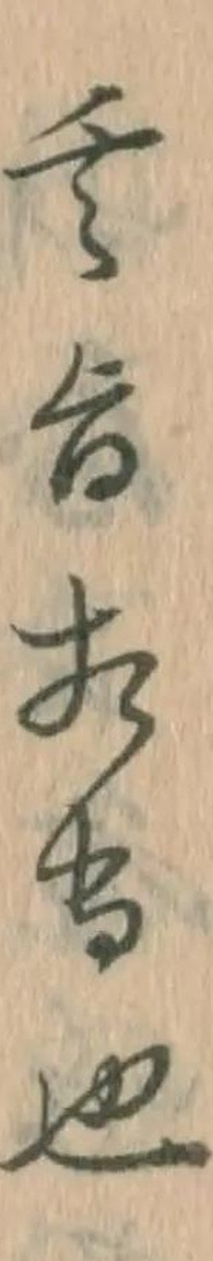其旨相守也
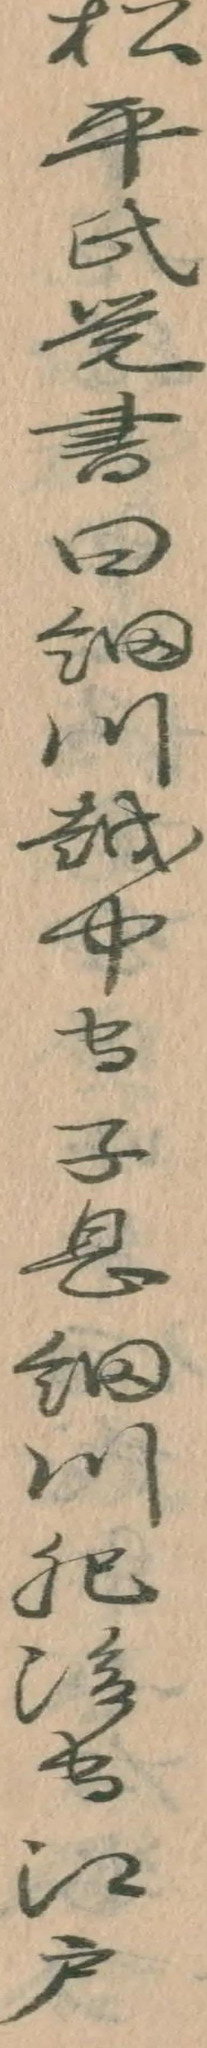松平氏覚書曰細川越中守子息細川肥後守江戸
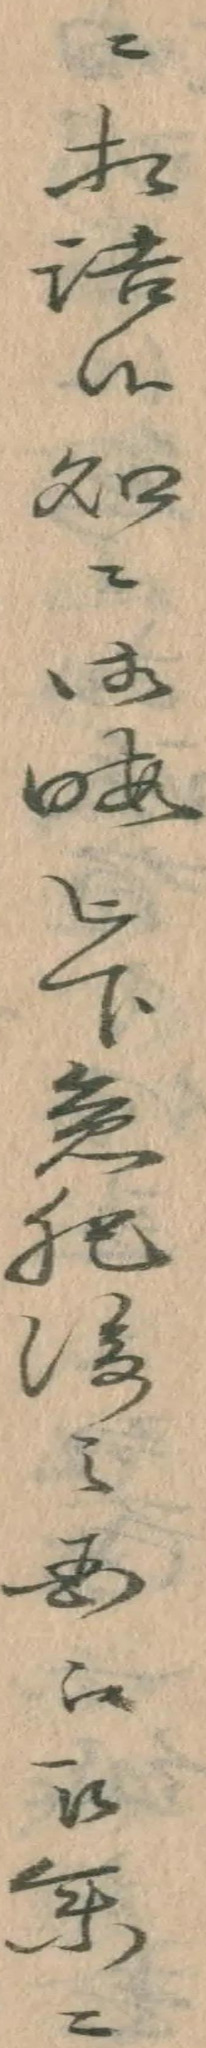に相詰候処に御暇被下急肥後之国江被参に
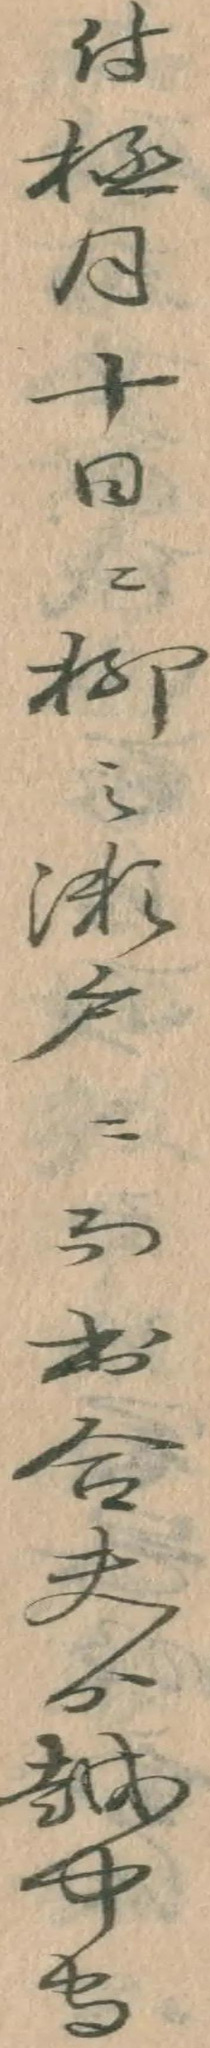付極月十日に柳之瀬戸に而出合夫ゟ越中守
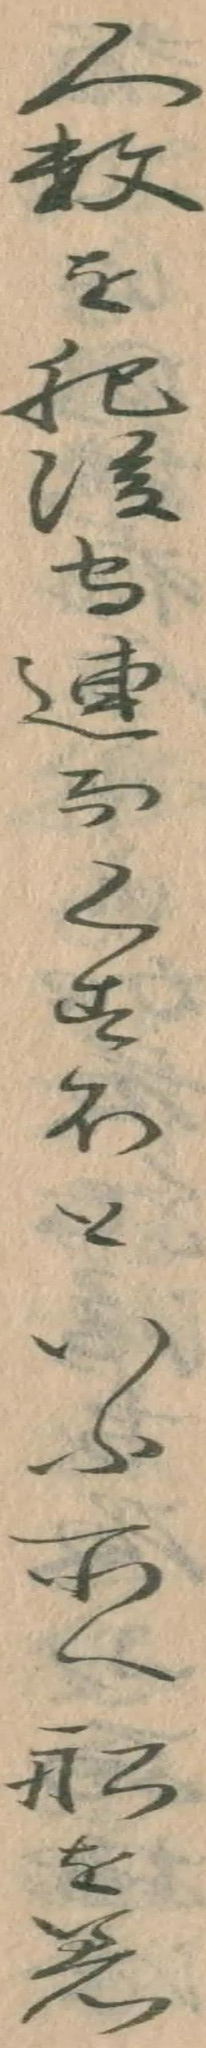人数を肥後守連而く春不といふ所へ舩を着
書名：切支丹御退治記 49巻. [4]
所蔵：国立国会図書館 National Diet Library, JAPAN
